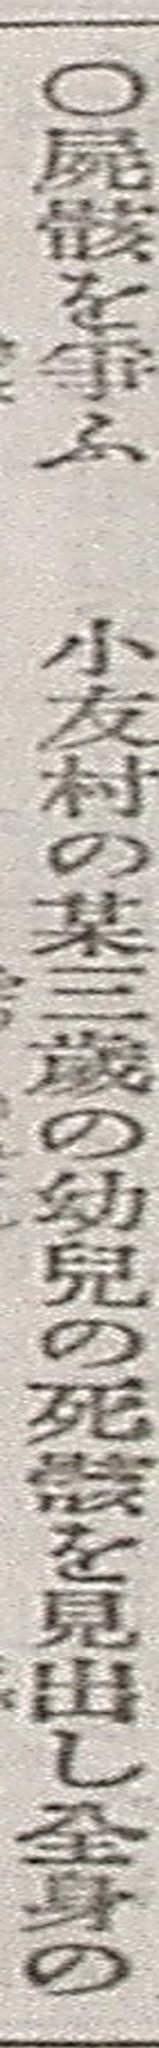○屍骸を争ふ小友村の某三歳の幼兒の屍骸を見出し全身の
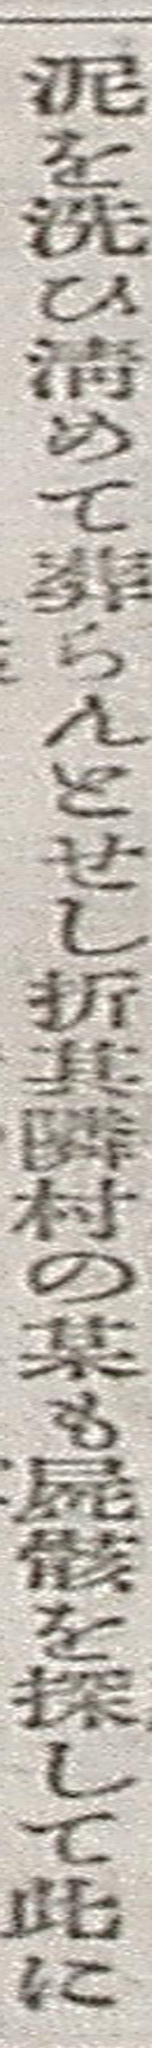泥を洗ひ清めて葬らんとせし折其隣村の某も屍骸を探して此に
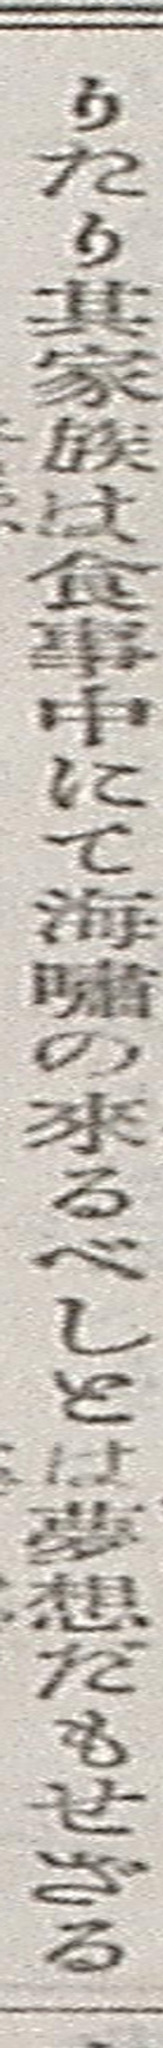りたり其家族は食事中にて海嘯の来るべしとは夢想だもせざる
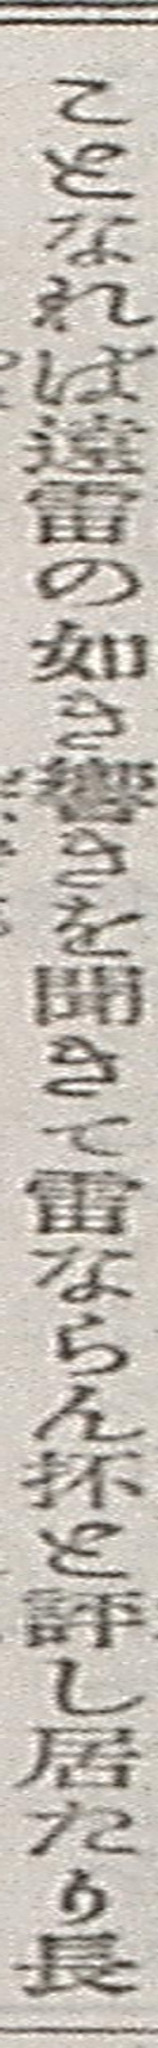ことなれば遠雷の如き響きを聞きて雷ならん抔と評し居たり長
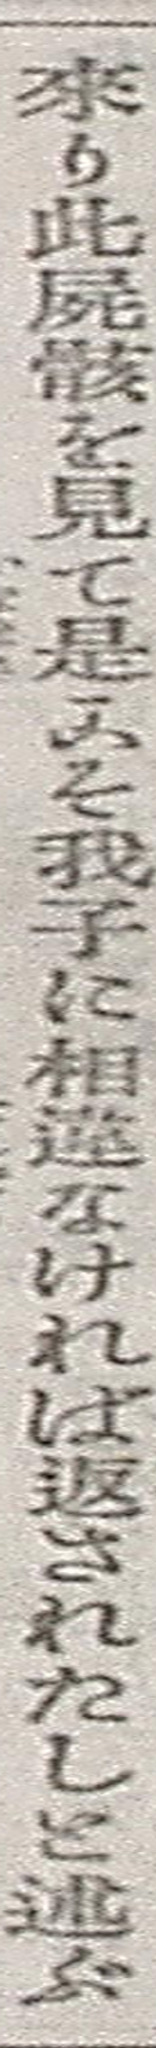来り此屍骸を見て是こそ我子に相違なければ返されたしと述ぶ
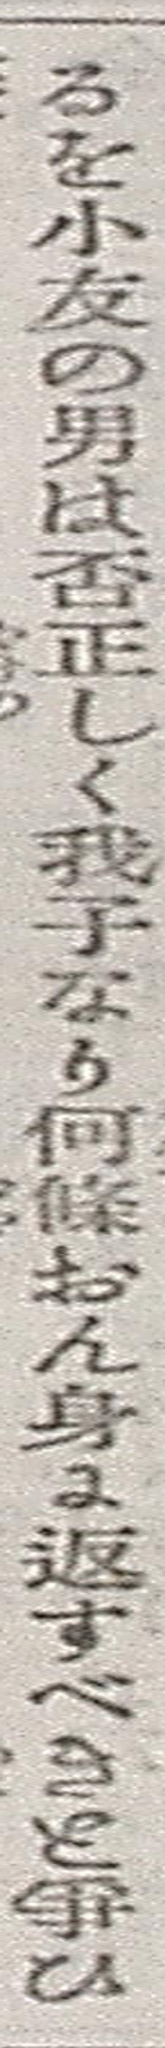るを小友の男は否正しく我子なり何条おん身に返すべきと争ひ
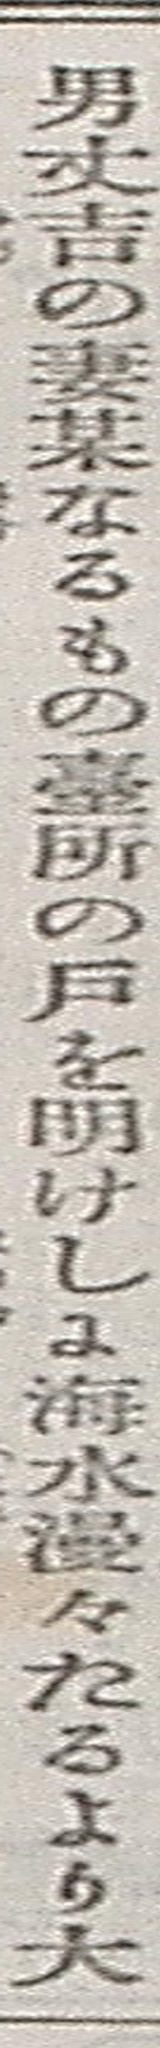男丈吉の妻某なるもの台所の戸を明けしに海水漫々たるより大
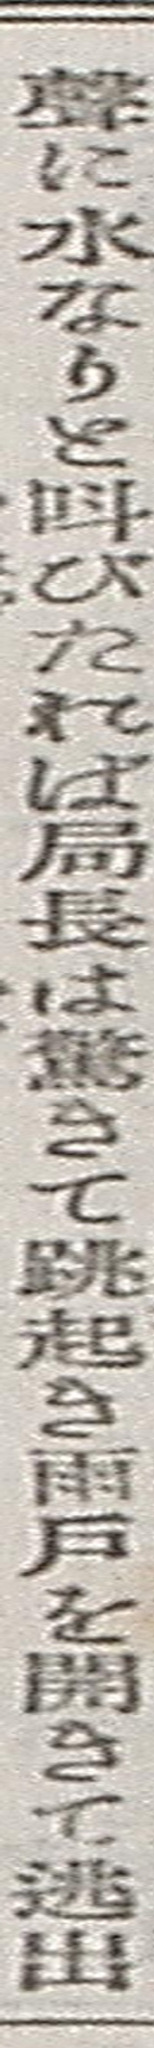声に水なりと叫びたれば局長は驚きて跳起き雨戸を開きて逃出
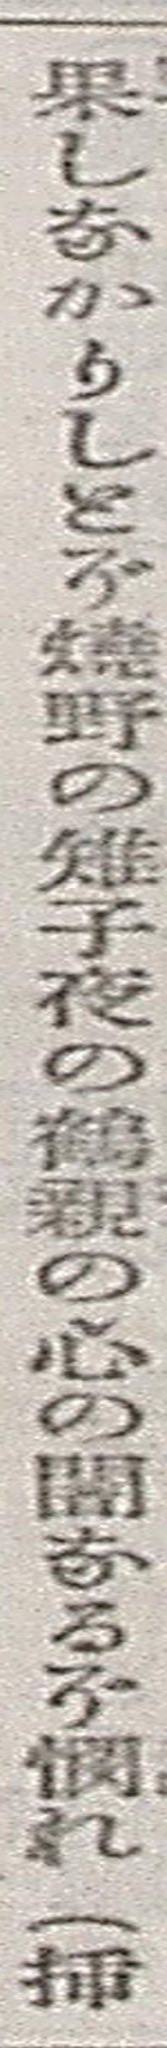果しなかりしとぞ焼野の雉子夜の鶴親の心の闇なるぞ憫れ（挿
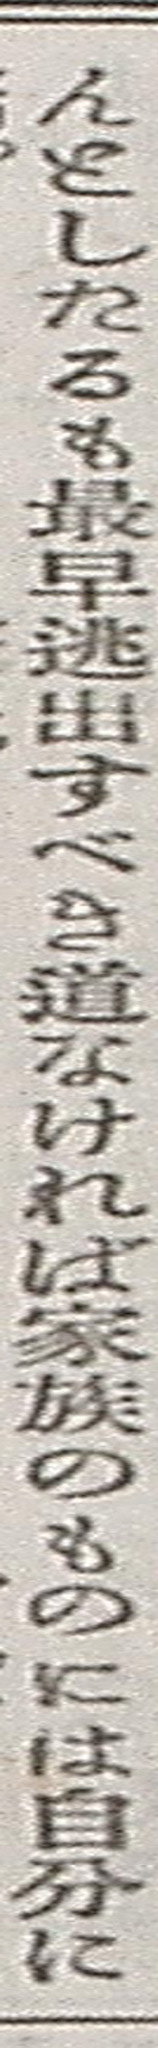んとしたるも最早逃出すべき道なければ家族のものには自分に
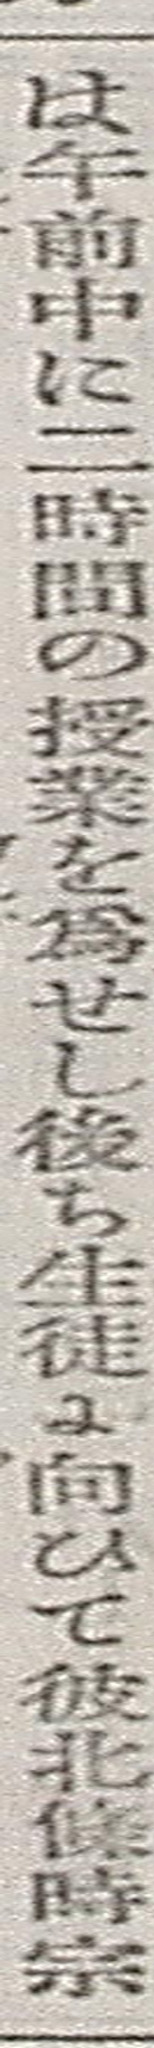は午前中に二時間の授業を為せし後ち生徒に向ひて彼北条時宗
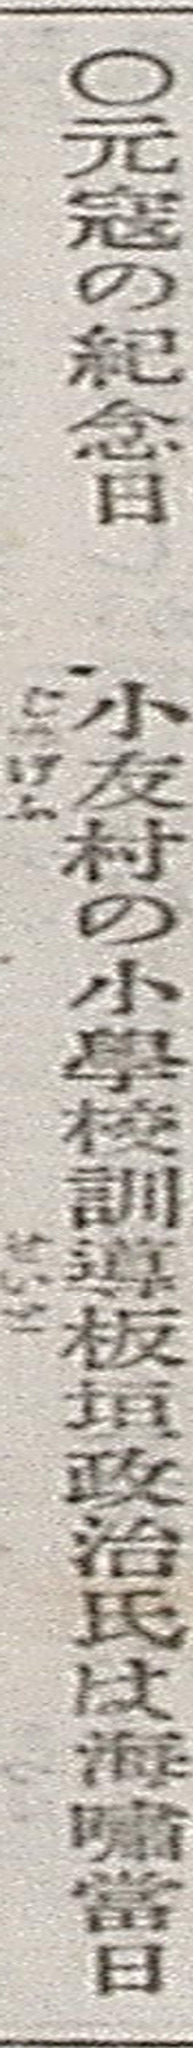○元寇の記念日小友村の小学校訓導板垣政治氏は海嘯当日
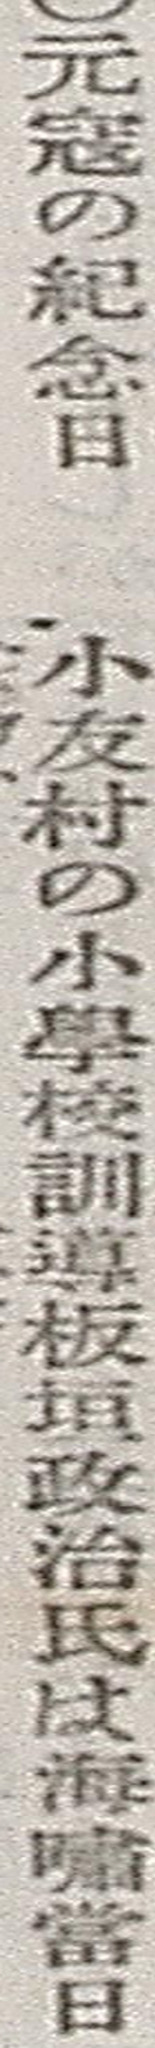○元寇の記念日小友村の小学校訓導板垣政治氏は海嘯当日
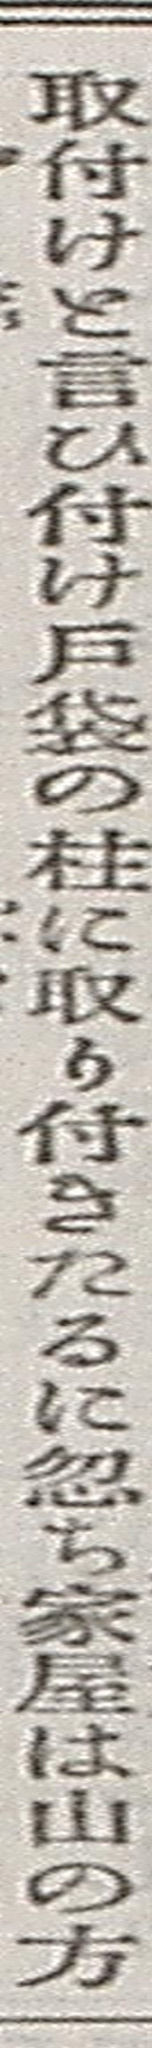取付けと言ひ付け戸袋の柱に取り付きたるに忽ち家屋は山の方
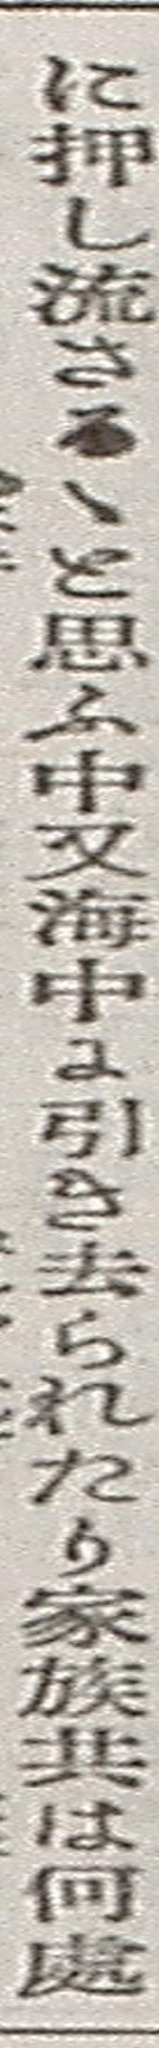に押し流さるゝと思ふ中又海中に引き去られたり家族共は何処
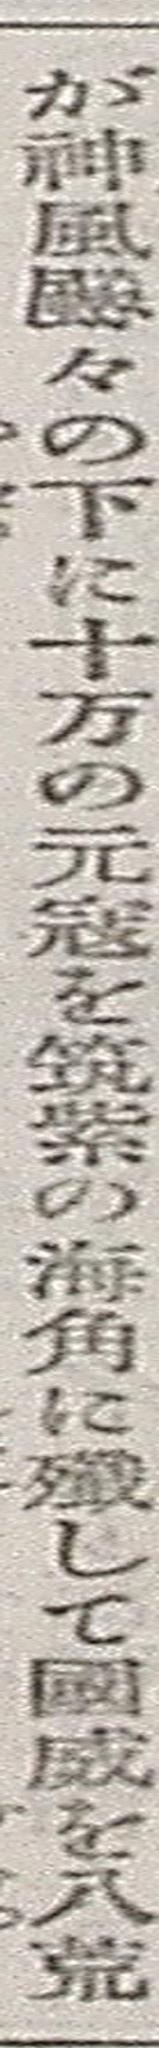が神風飈々の下に十万の元寇を筑紫の海角に殲して国威を八荒
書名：風俗畫報臨時増刊第百二十號　大海嘯被害録（下）
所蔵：東京大学地震研究所図書室 Earthquake Research Institute Library, The University of Tokyo, JAPAN
